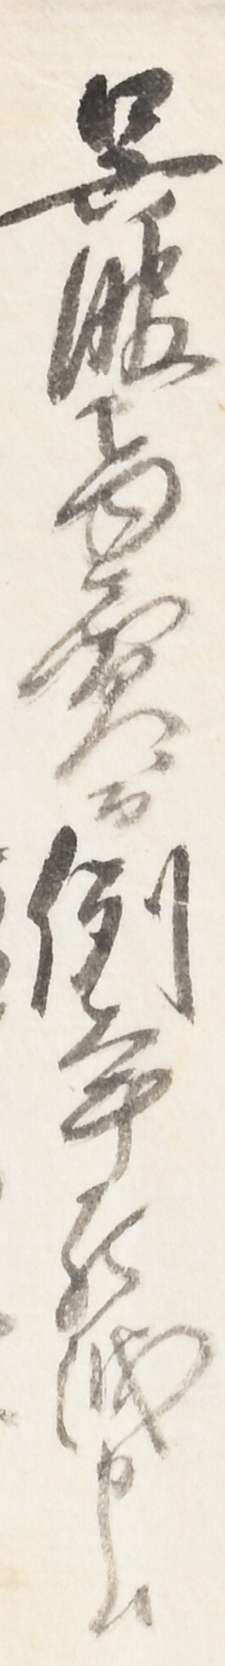呉服商売ニ而例年罷越申候
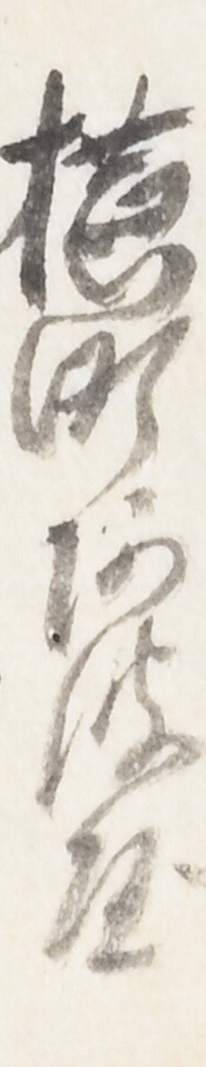横町阿波屋
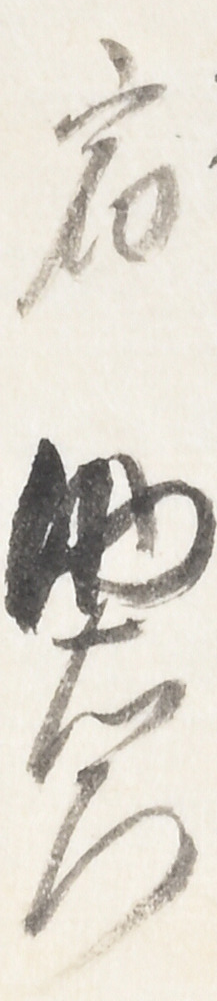宿助右衛門
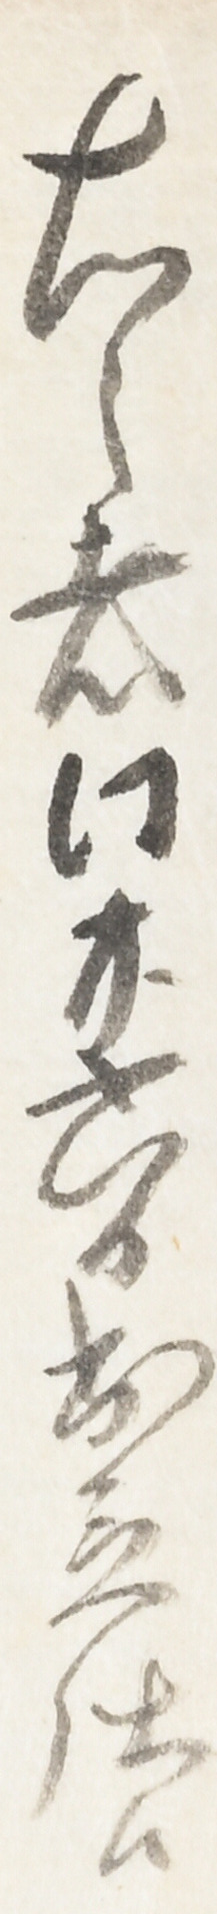右之者同廿六日出立仕候
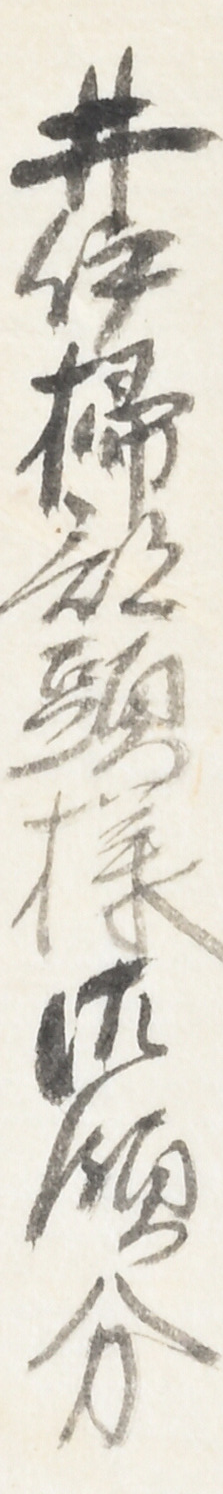井伊掃部頭様御領分
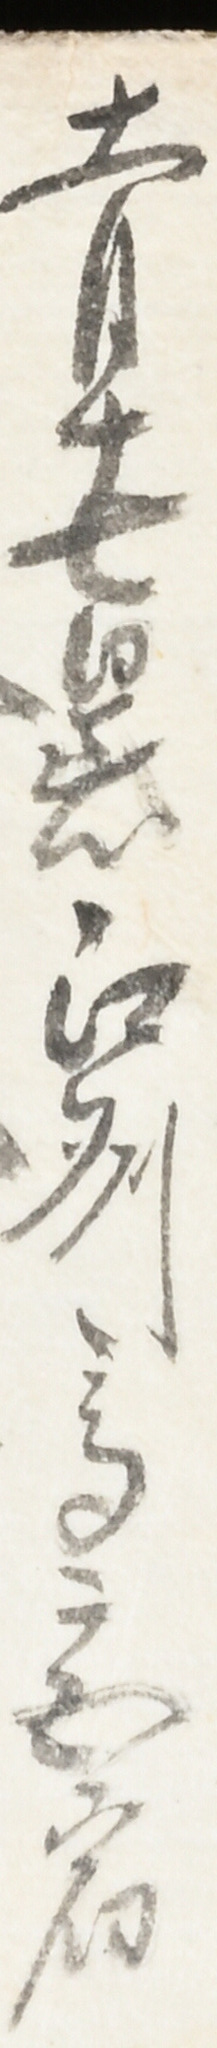十一月十七日着江州高宮宿
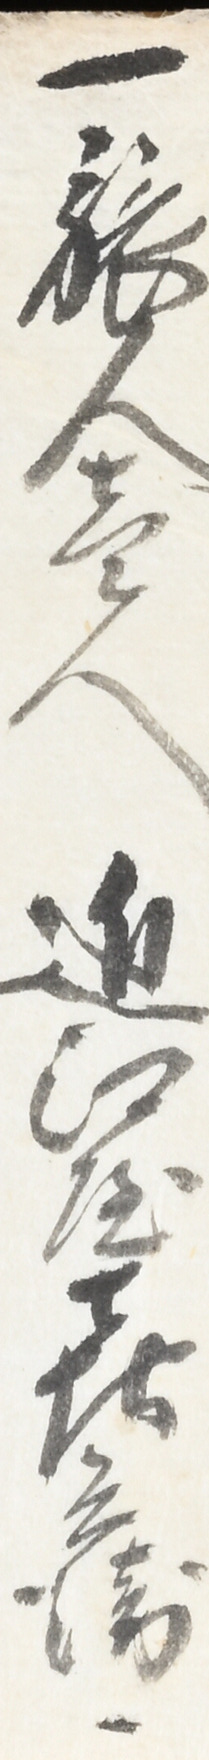一旅人壱人近江屋喜兵衛・
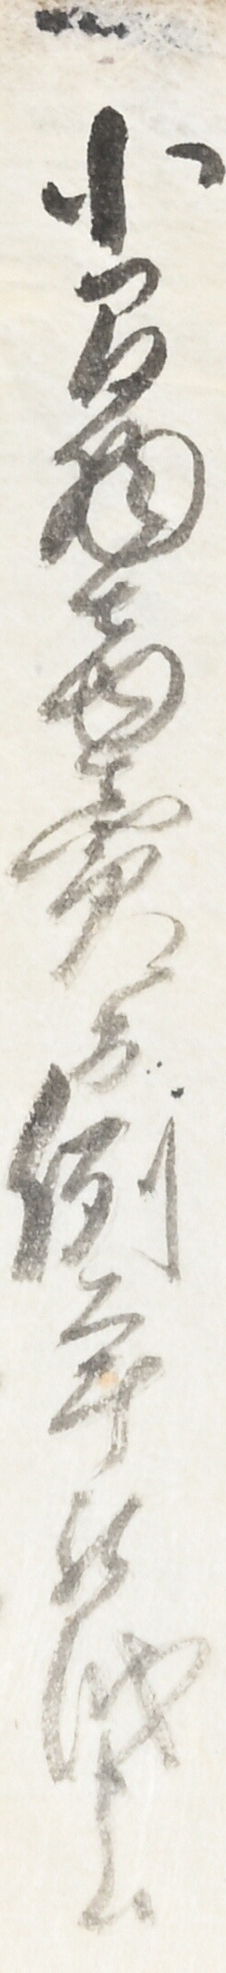小間物商売ニ而例年罷越申候
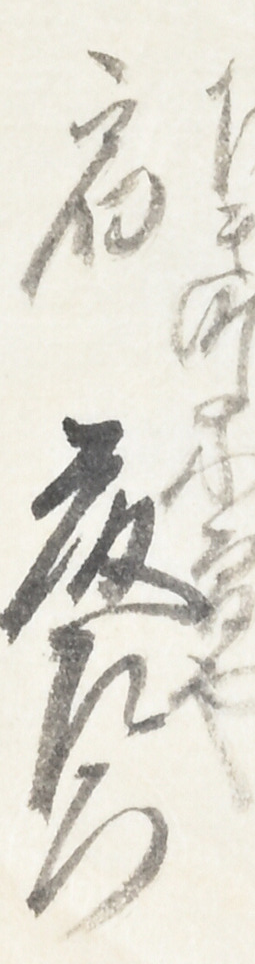宿籐左衛門
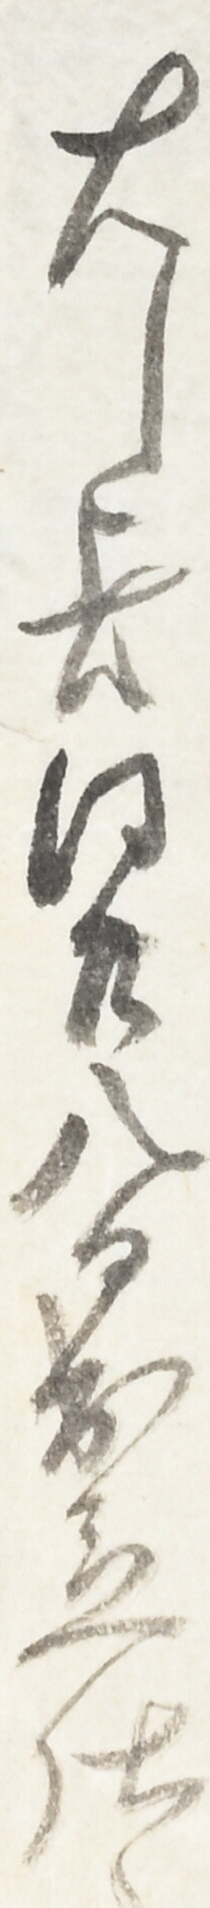右之者同廿八日出立仕候

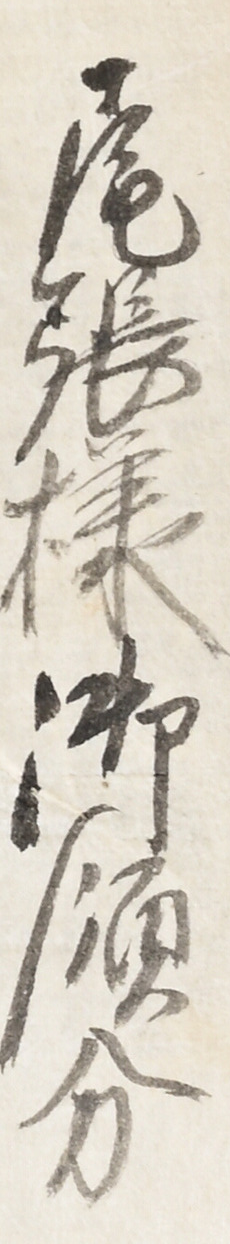尾張様御領分
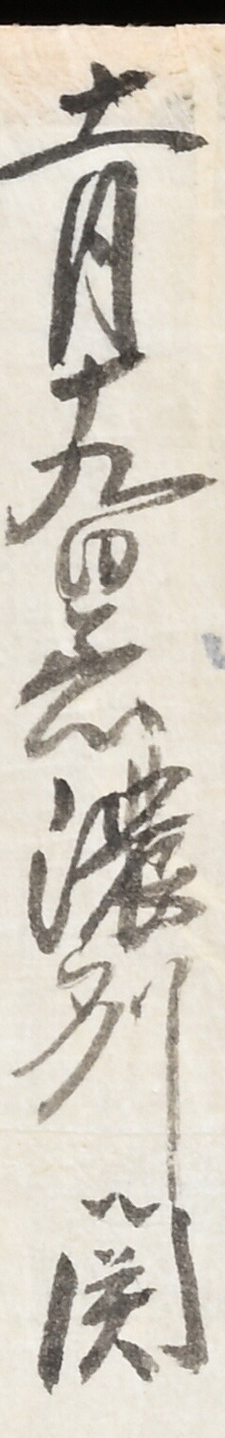十一月十九日着濃州関
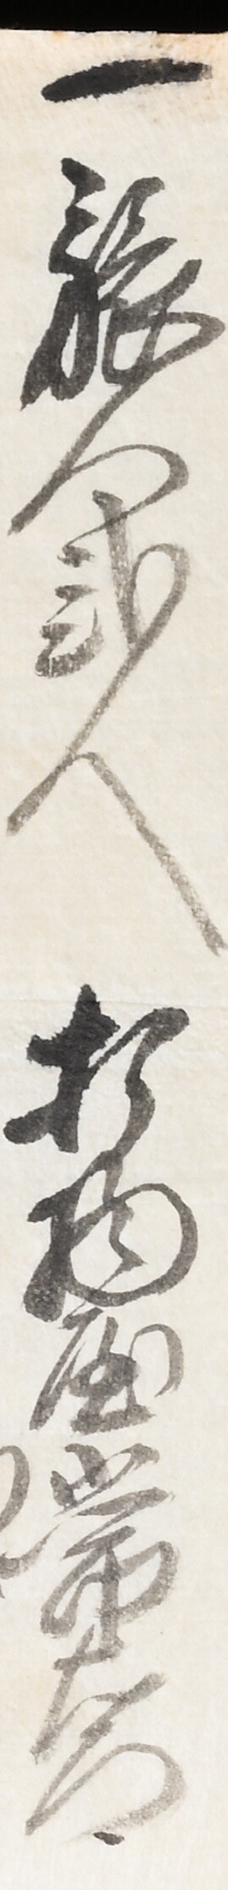一旅人弐人打物屋常右衛門・
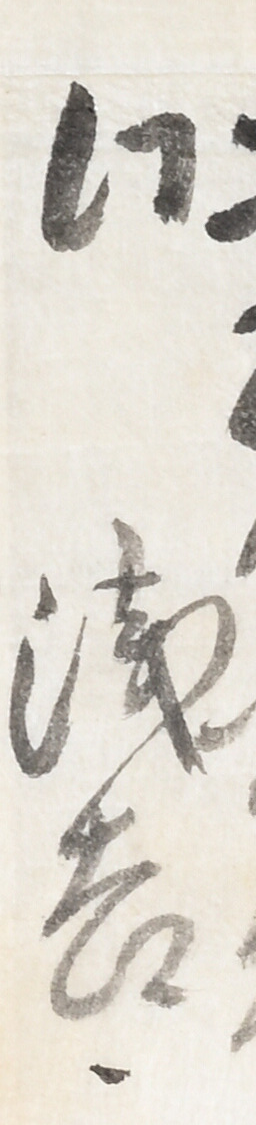同浅吉・
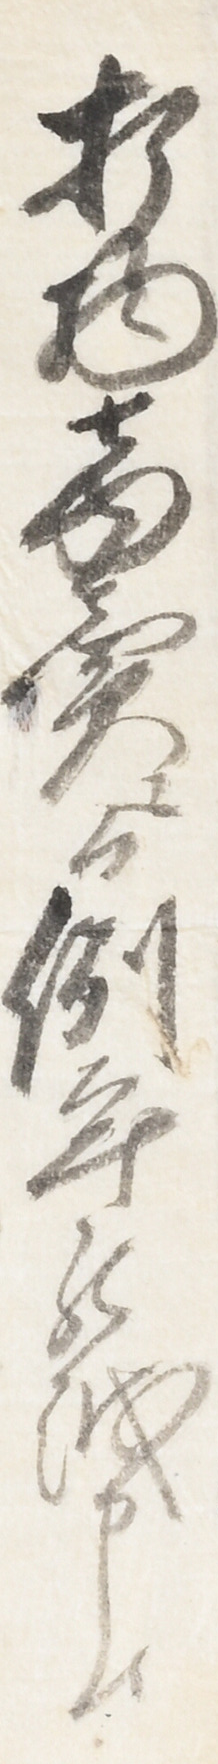打物商売ニ而例年罷越申候
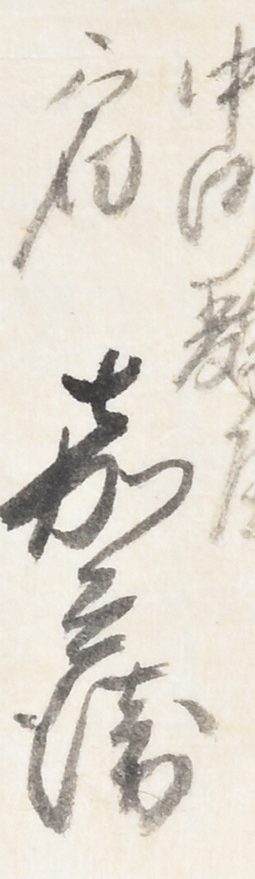宿嘉兵衛
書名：旅人泊控帳
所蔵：伊那市立高遠町図書館・合同会社AMANE
